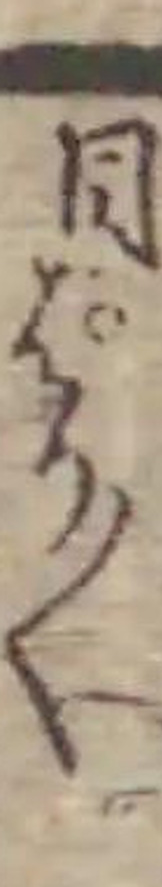目ぱり〳〵
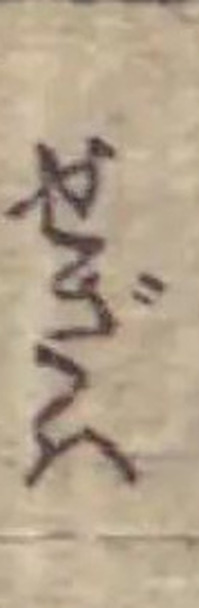せざは
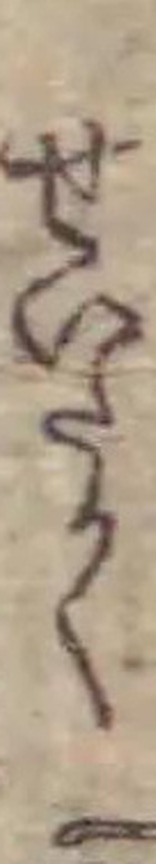せいたかく

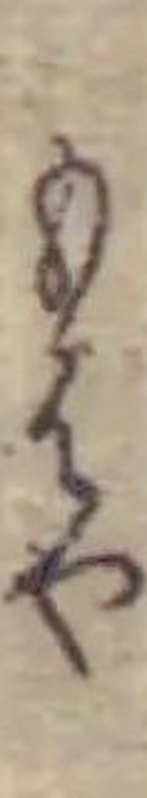もはや
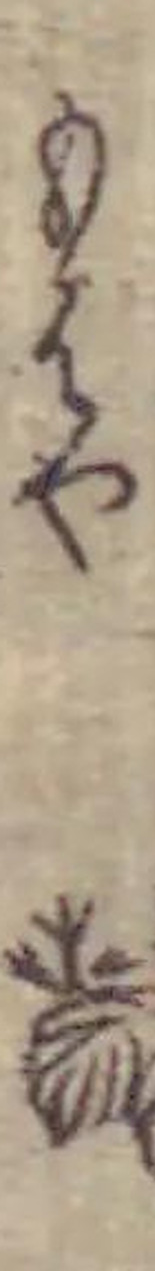もはや
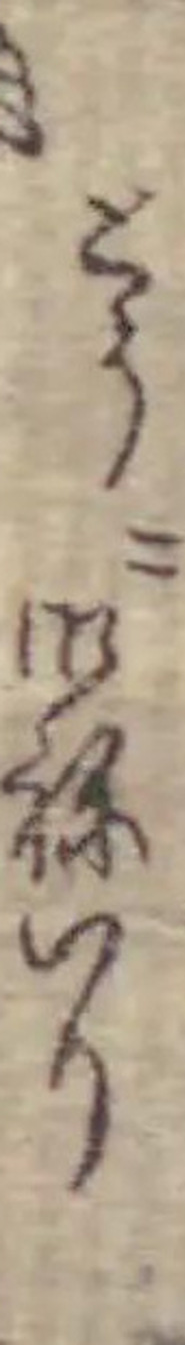とう御ねいり
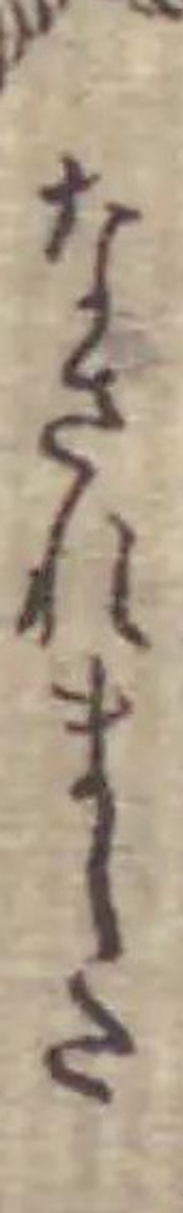なされました
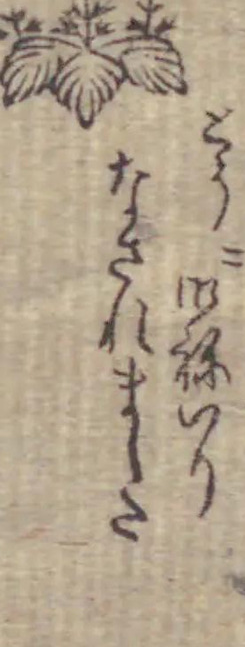なされました
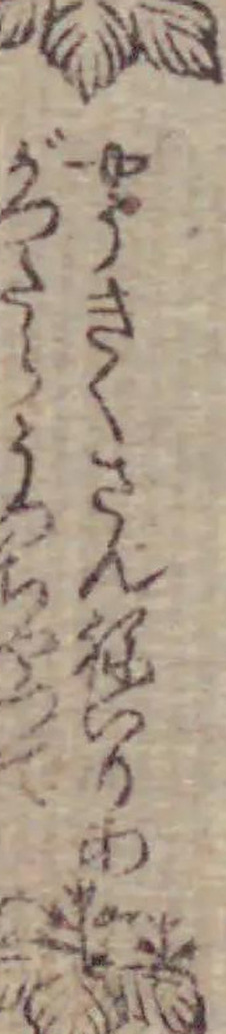やうきくさんねいりあ
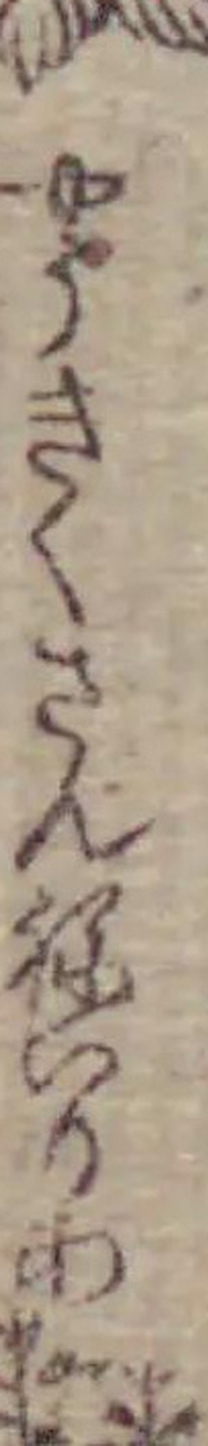やうきくさんねいりあ
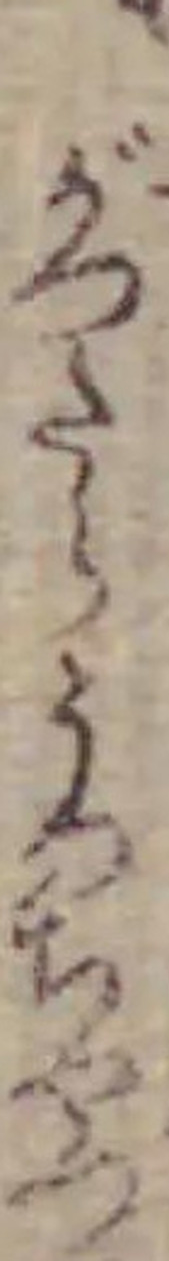がつたらうつちやつて
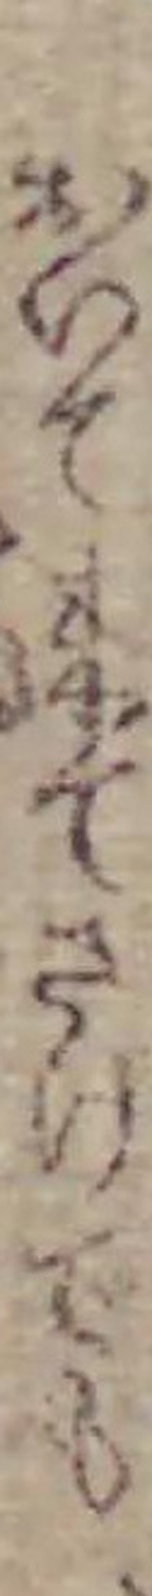おいて来てさけでも
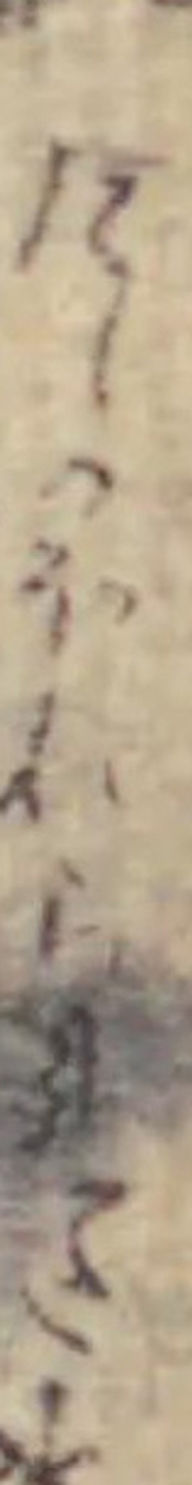たしかほれられた
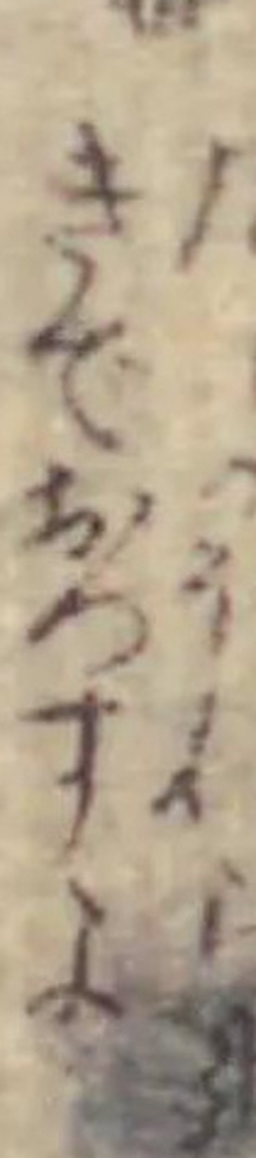きでおつすよ
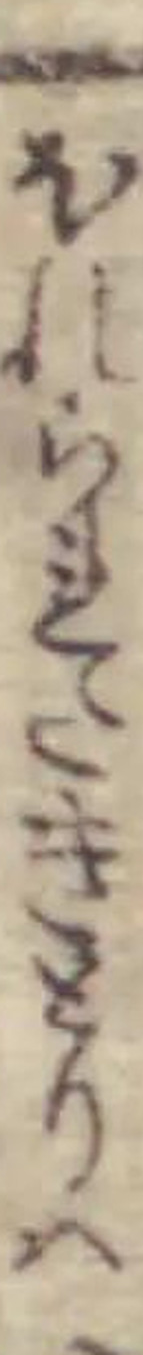ほれられたきどりは
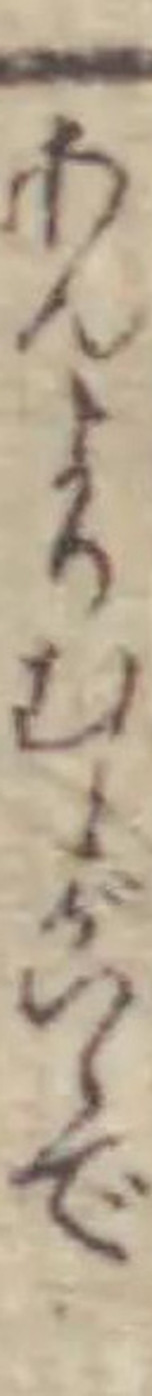あんまりむしがいゝで
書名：亀山人家妖 3巻
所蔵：国立国会図書館 National Diet Library, JAPAN
